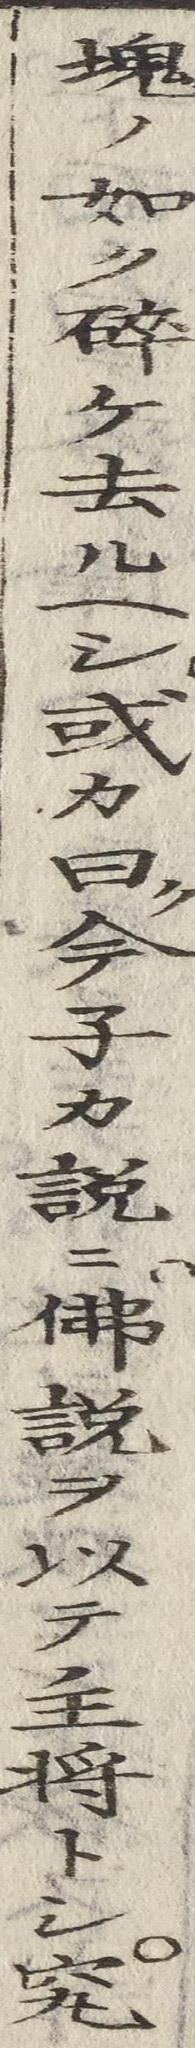塊ノ如ク砕ケ去ルヘシ。或カ曰今予カ説ニ。仏説ヲ以テ主将トシ。究
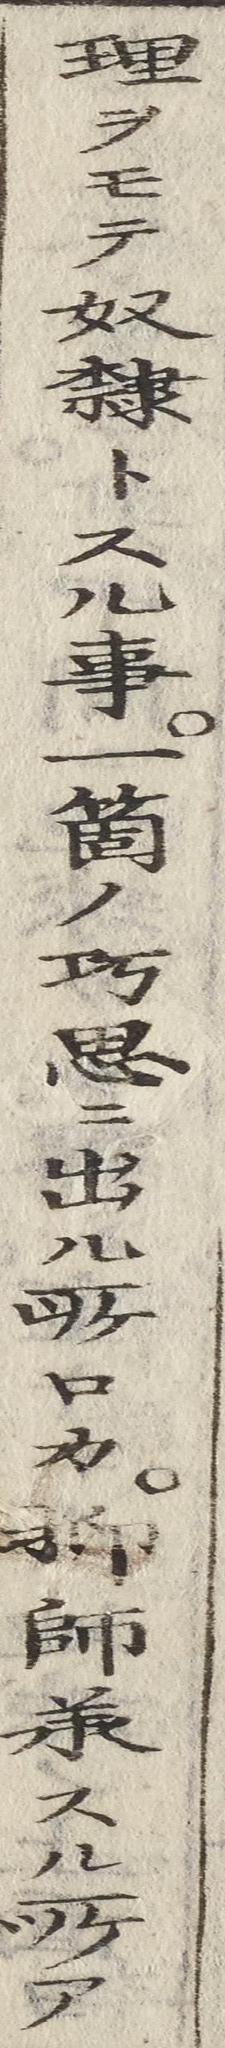理ヲモテ奴隷トスル事。一箇ノ巧思ニ出ル所ロカ。抑師羕スル所ア
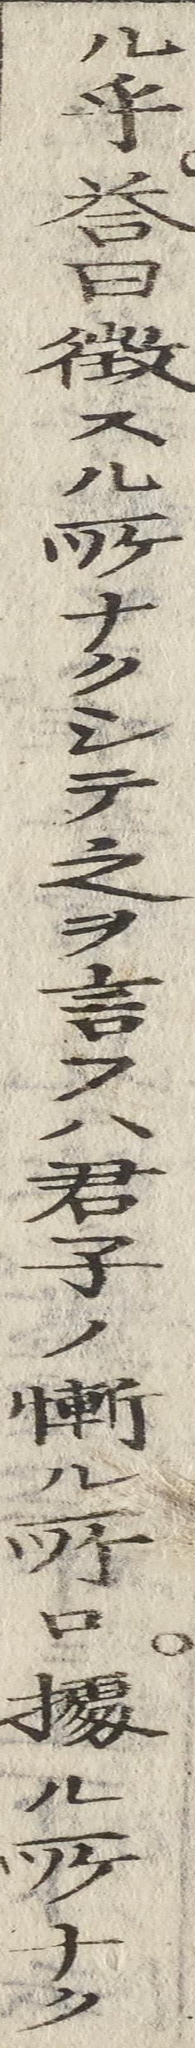ル乎。答曰徴スル所ナクシテ之ヲ言フハ君子ノ慚ル所ロ。拠ル所ナク
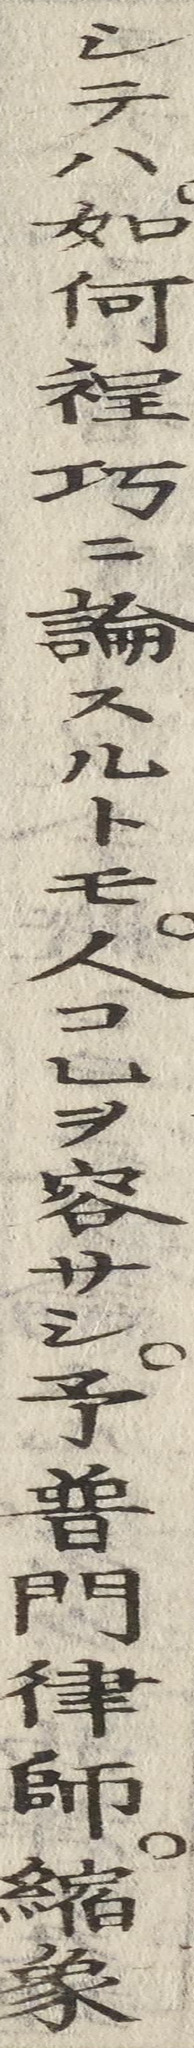シテハ。如何程巧ニ論スルトモ。人コレヲ容サシ。予普門律師。縮象
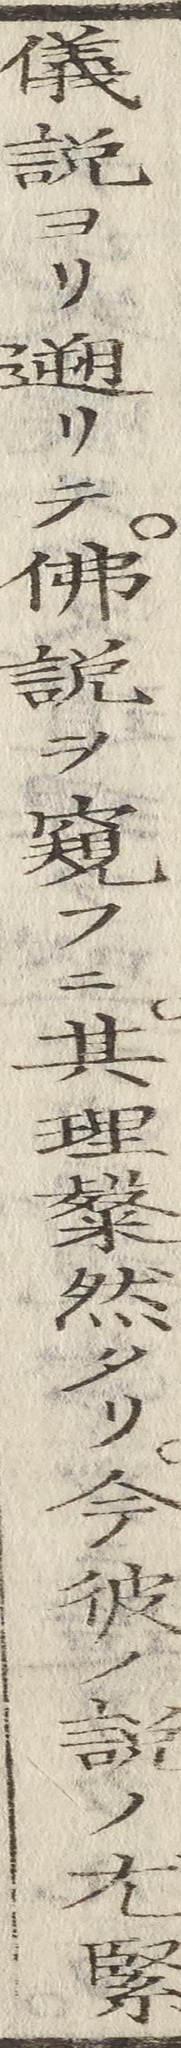儀説ヨリ遡リテ。仏説ヲ窺フニ。其理粲然タリ。今彼ノ説ノ。尤緊
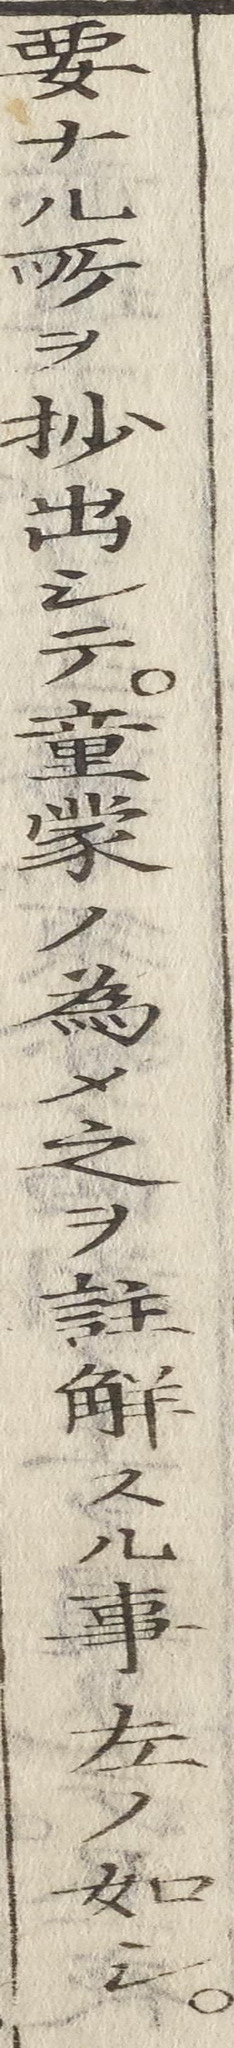要ナル所ヲ抄出シテ。童蒙ノ為メ之ヲ註鮮スル事左ノ如シ。
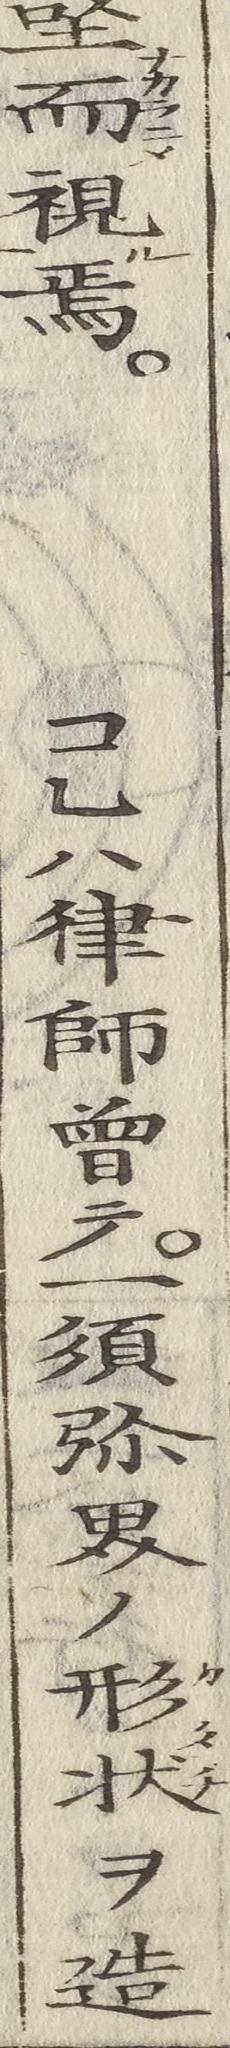坐而視焉。コレハ律師曾テ。一須弥界ノ形状ヲ造
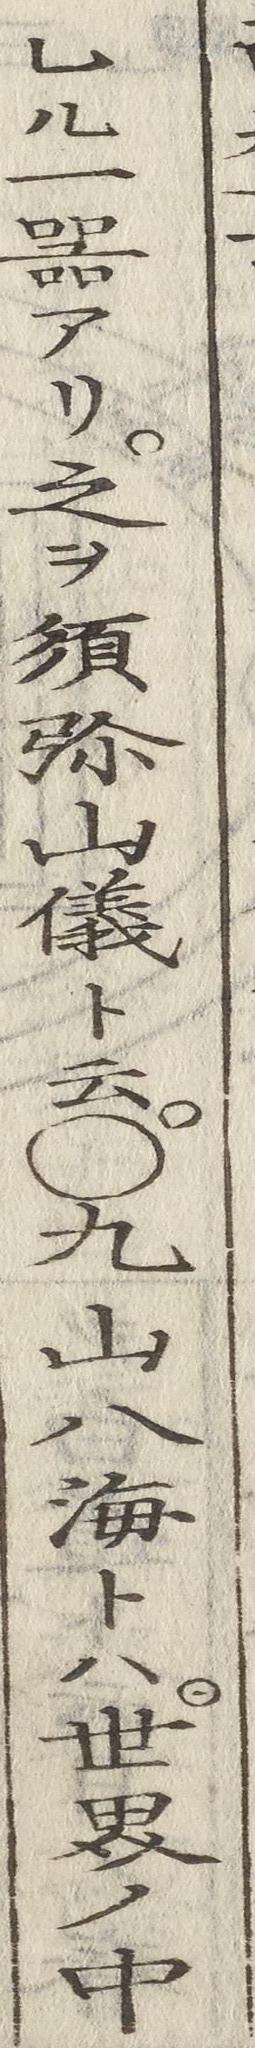レル一器アリ。之ヲ須弥山儀ト云。○九山八海トハ。世界ノ中
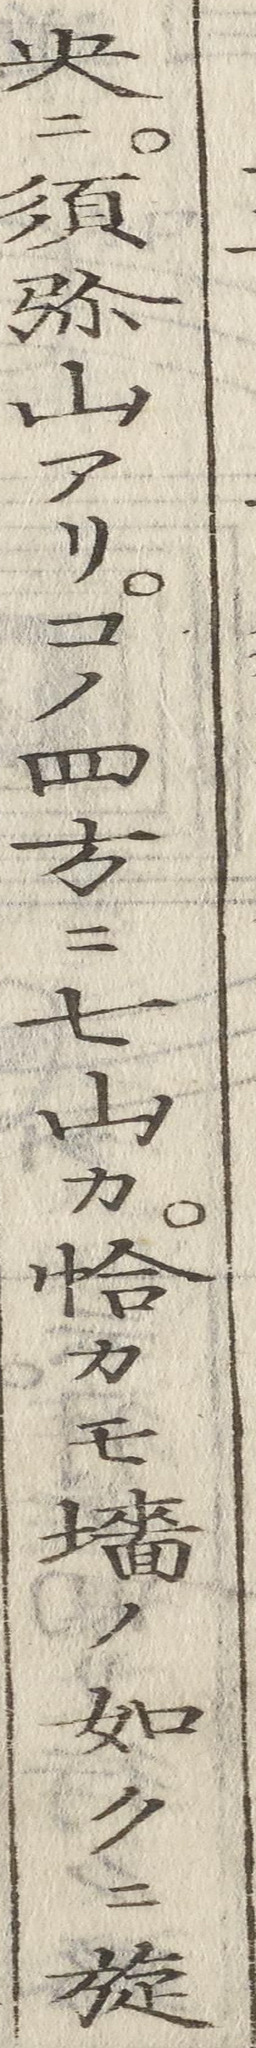央ニ。須弥山アリ。コノ四方ニ七山カ恰カモ墻ノ如クニ旋
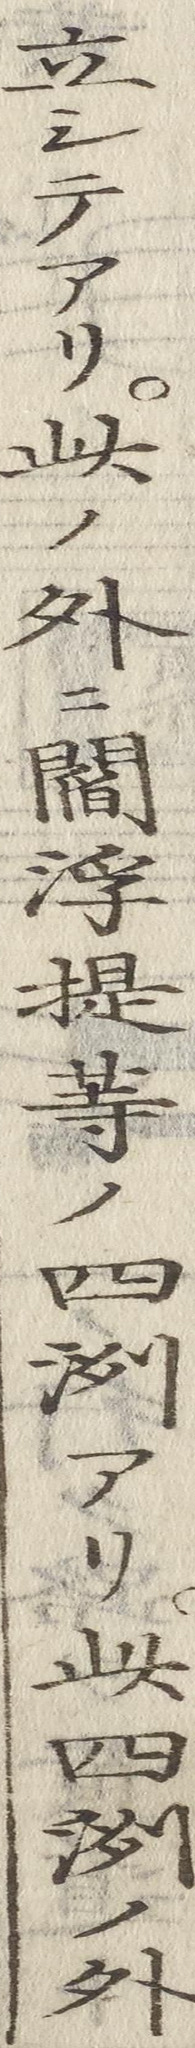立シテアリ。此ノ外ニ閻浮提等ノ四洌アリ。此四洌ノ外
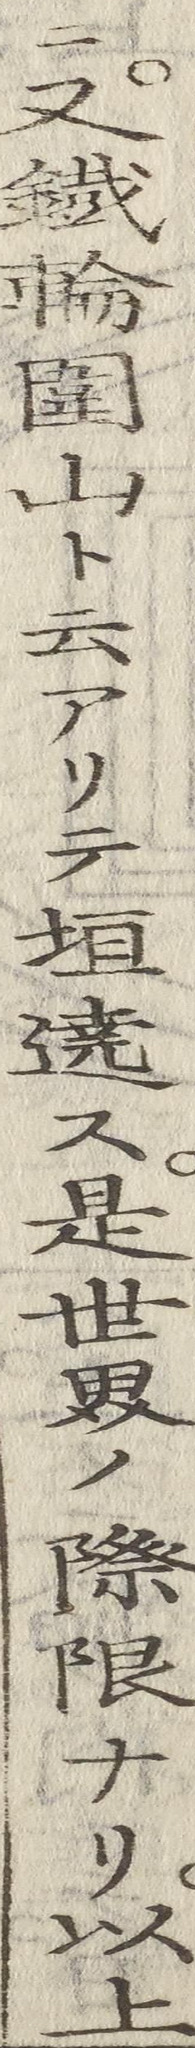ニ。又鉄輪囲山ト云アリテ垣遶ス。是世界ノ際限ナリ。以上
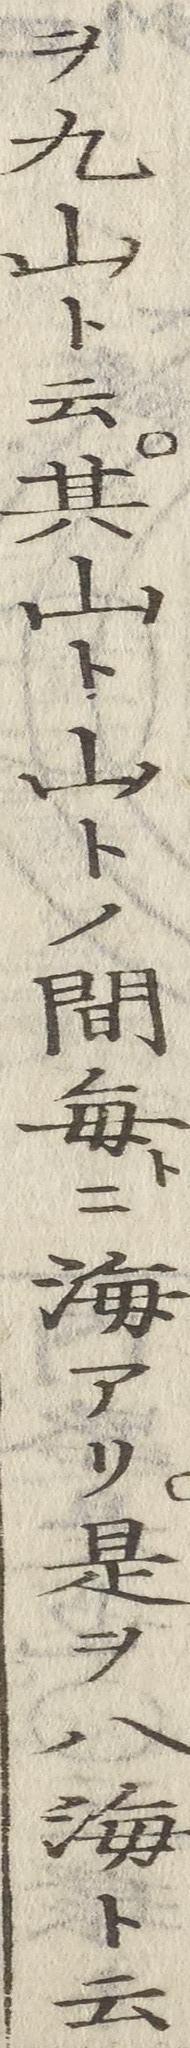ヲ九山ト云。其山ト山トノ間毎海アリ。是ヲ八海ト云
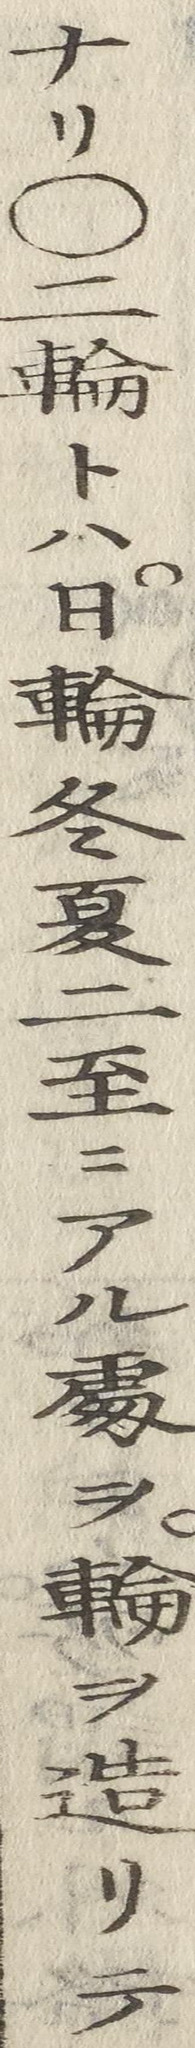ナリ○二輪トハ。日輪冬夏二至ニアル処ヲ。輪ヲ造リテ

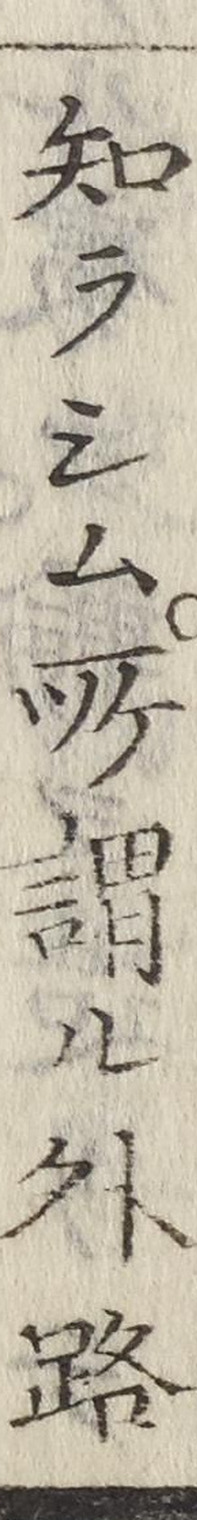知ラシム。所謂ル外路
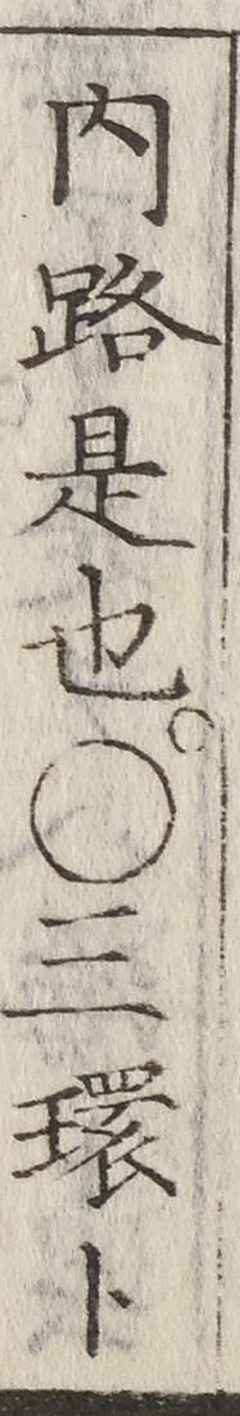内路是也。○三環ト
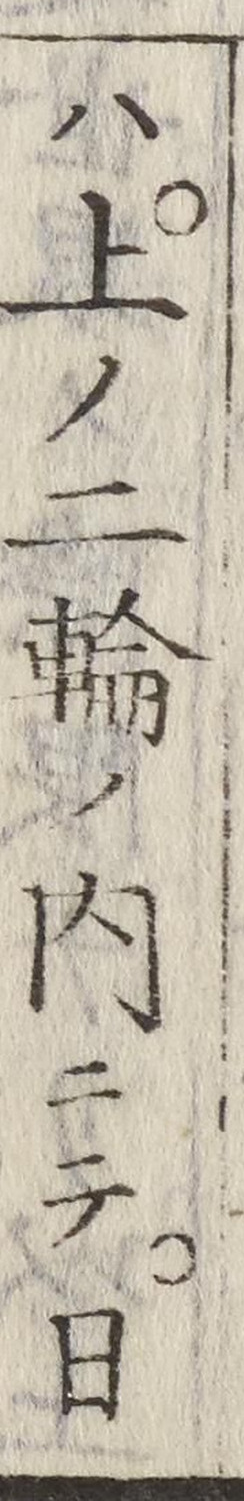ハ。上ノ二輪ノ内ニテ。日
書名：護法新論　上
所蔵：東京大学地震研究所図書室 Earthquake Research Institute Library, The University of Tokyo, JAPAN
